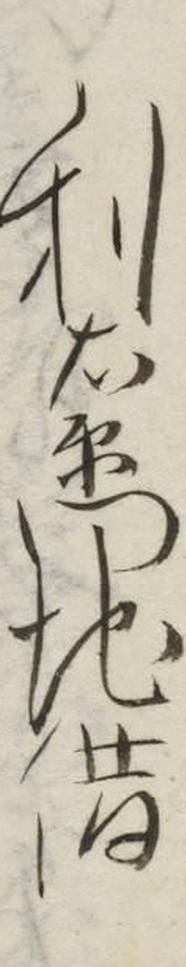利右衛門地借
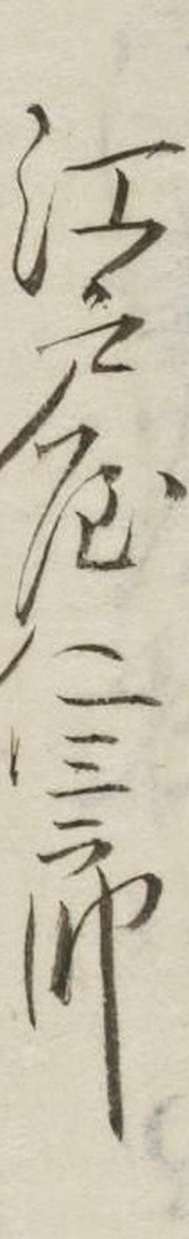江戸屋仁三郎
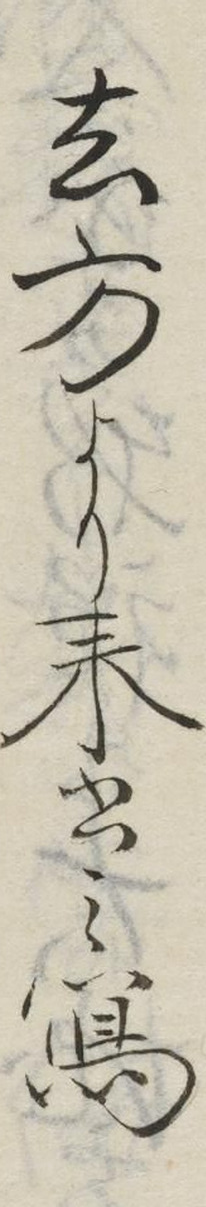去方より来書之写
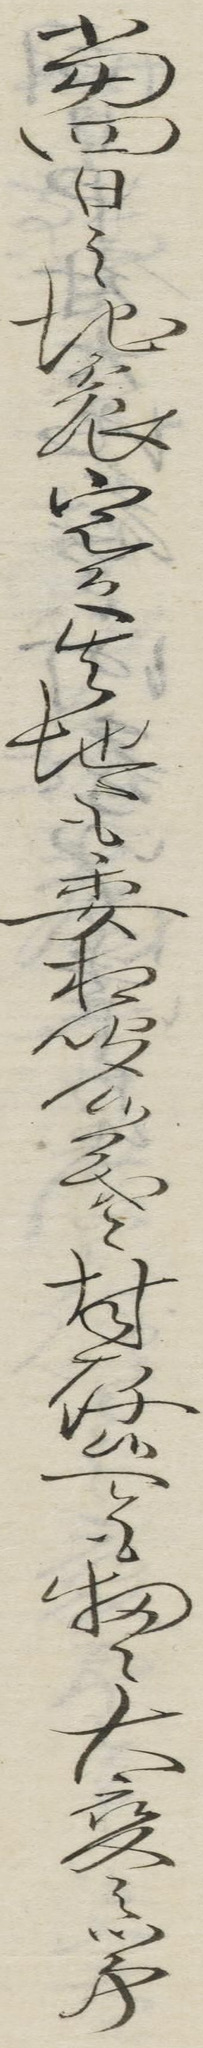当四日之地震定而其地も委相聞候義と奉存候へとも扨〻大変之御事
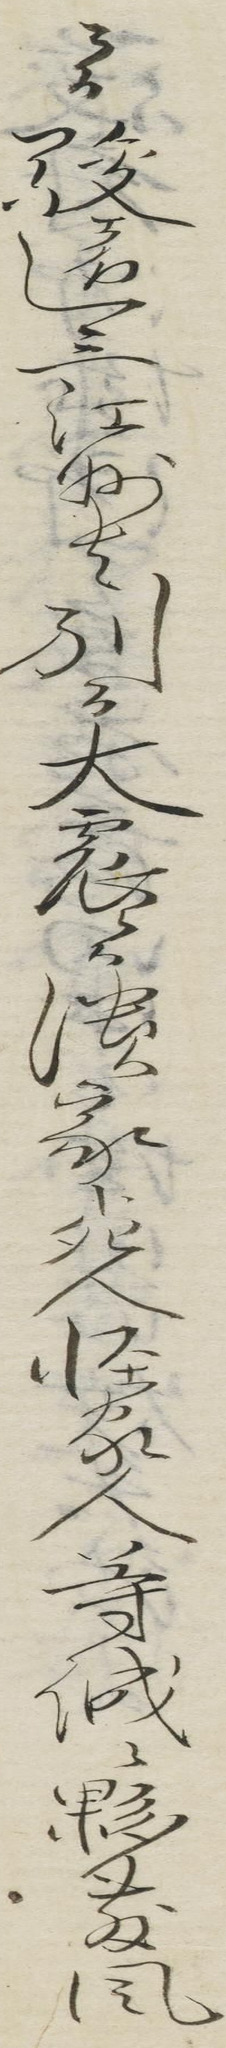ニ而駿遠三江州は別而大地震ニ而潰家死人怪我人等誠ニ夥敷風
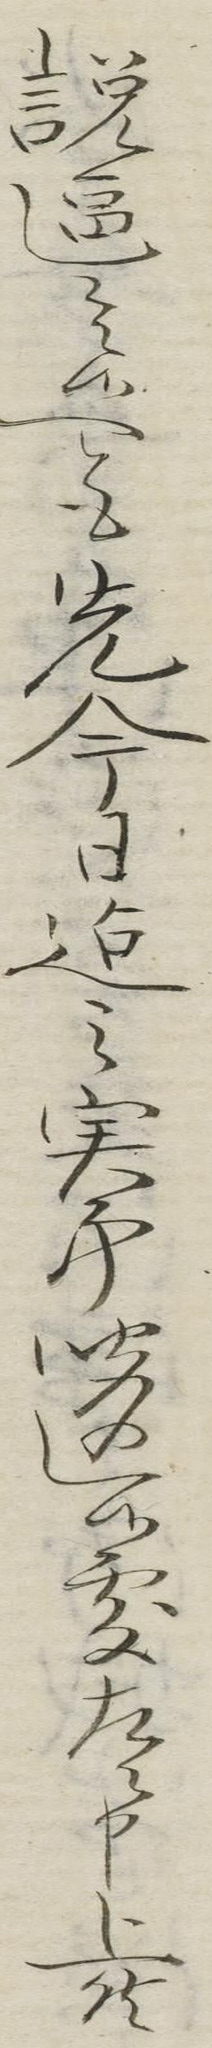説逼々二候へとも先今日迄之実事聞込候処左ニ申上候
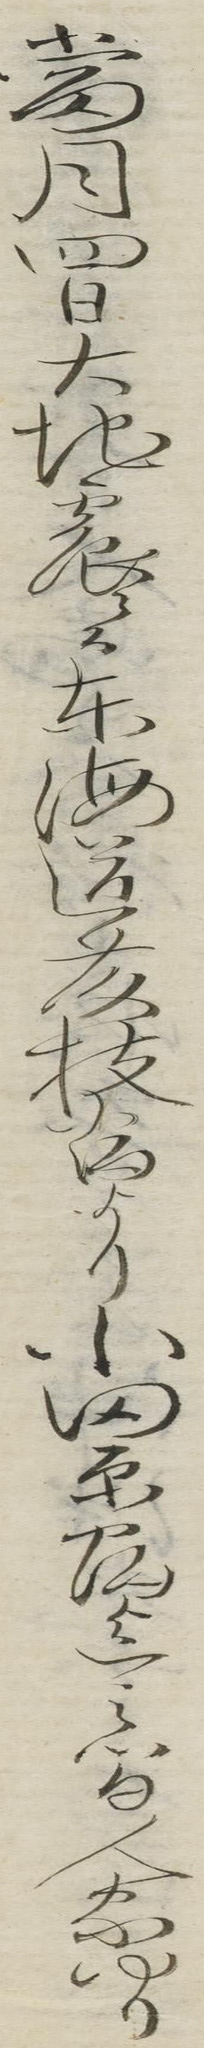当月四日大地震ニ而東海道藤枝宿より小田原宿迄之間人家ゆり

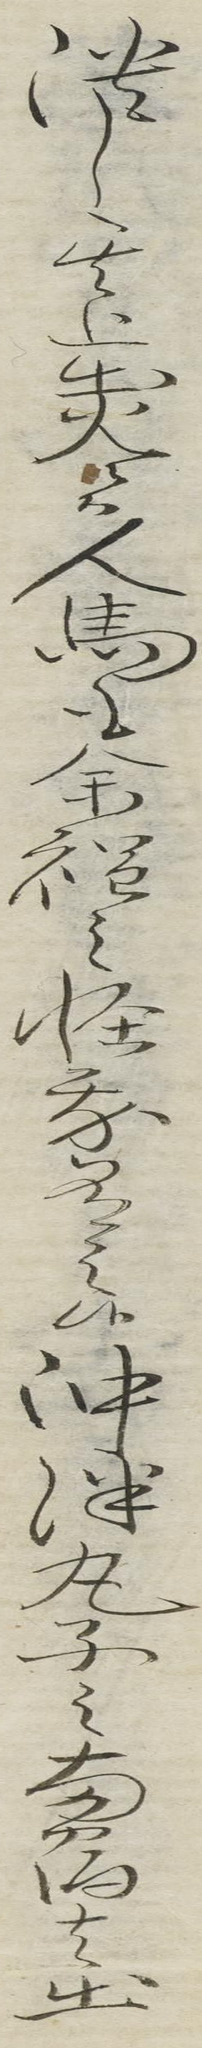潰し其上出火ニ而人馬も余程之怪我有之候沖津丸子之両宿は出
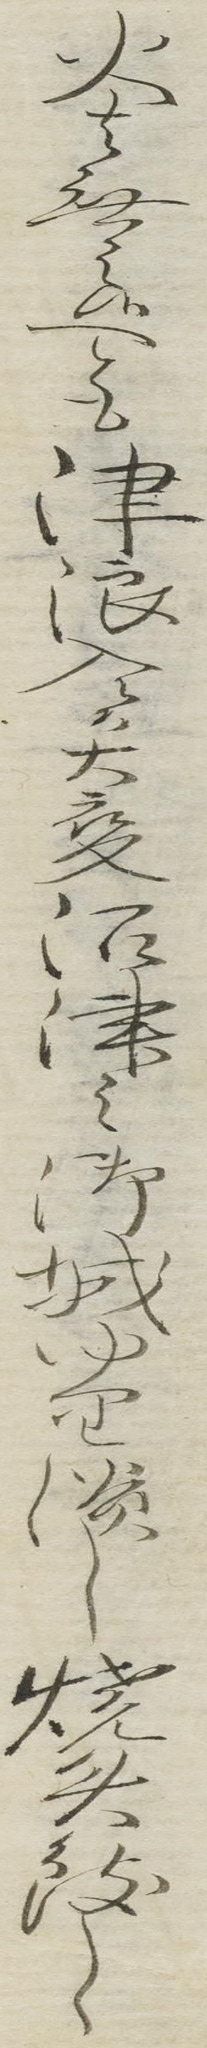火は無之候へとも津浪入ニ而大変沼津の御城ゆり潰し焼失致し
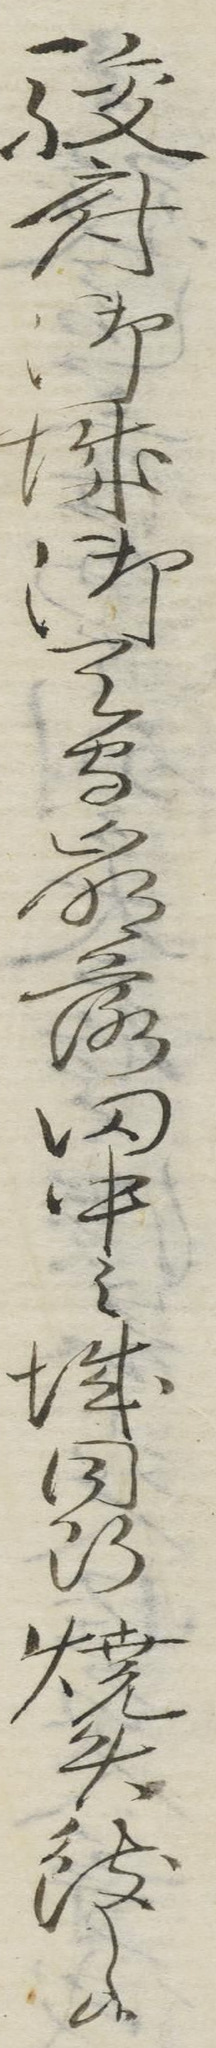駿府御城御天守崩落田中之城同断焼失致し候
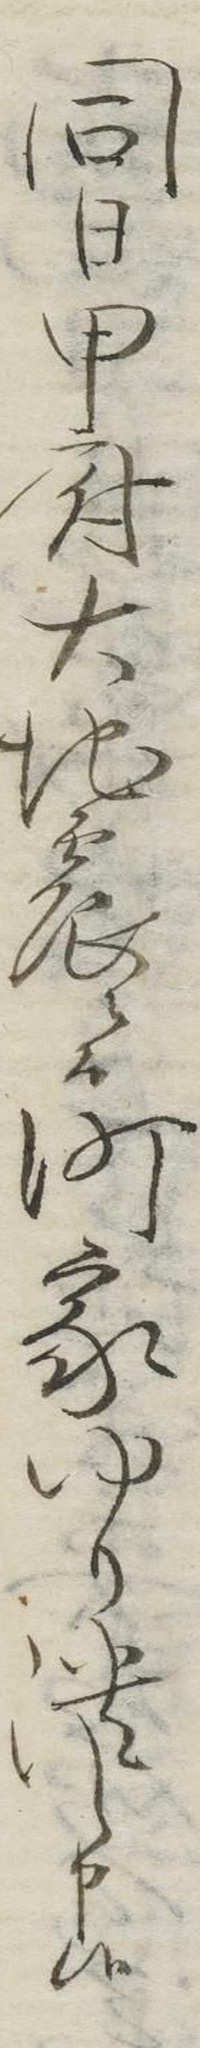同日甲府大地震ニ而町家ゆり潰し申候
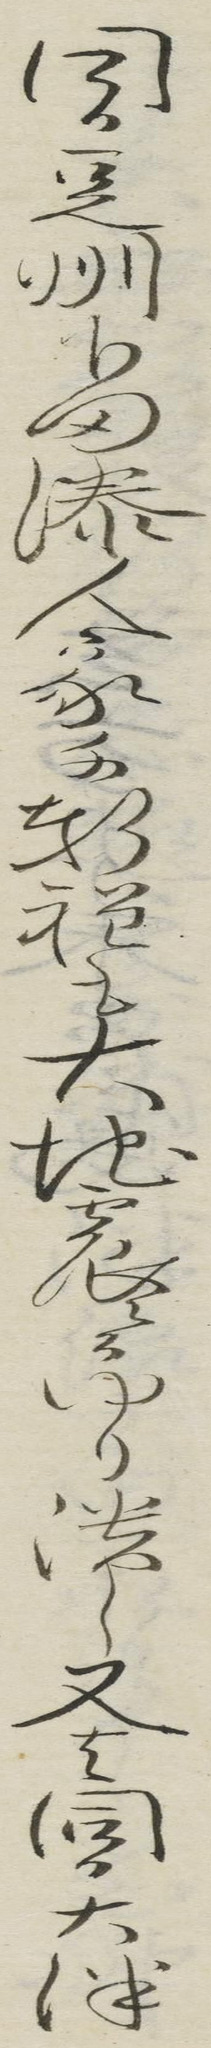同日豆州下田湊人家千軒程も大地震ニ而ゆり潰し又は同日大津
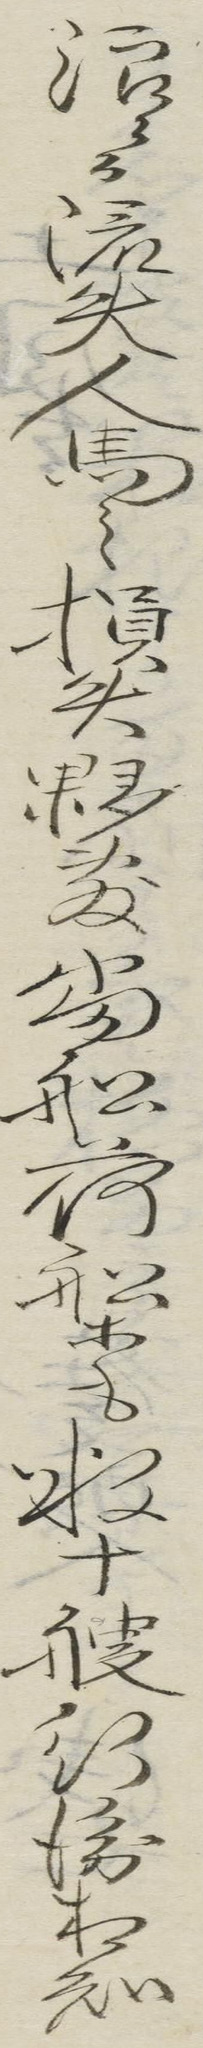浪ニ而流失人馬之損失夥敷番船荷船等も数十艘行衛相知
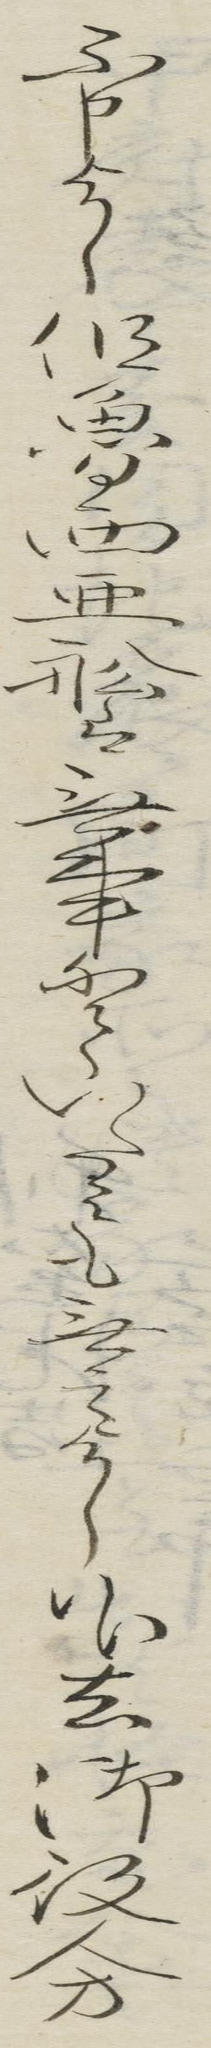不申よし但魯西亜船は無事にていたミも無之よし候去御役人方
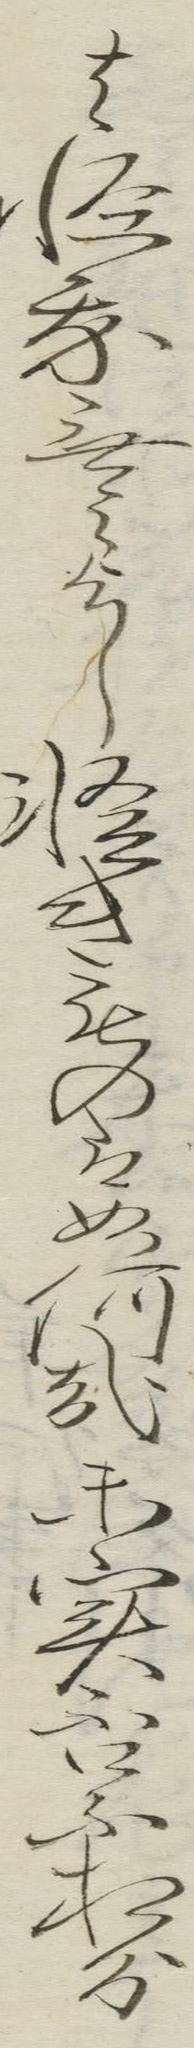は怪我無之よし軽きものは如何哉未実否不相分
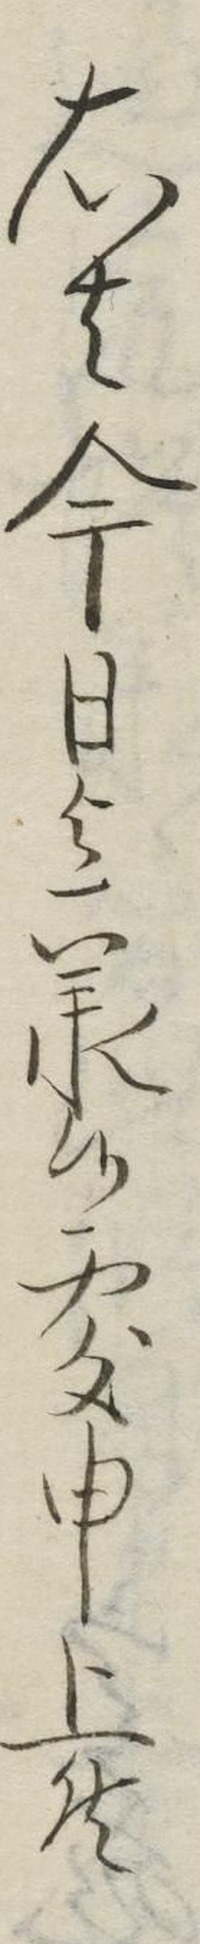右は今日迄承候処申上候
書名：大地震實録
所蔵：東京大学地震研究所図書室 Earthquake Research Institute Library, The University of Tokyo, JAPAN
